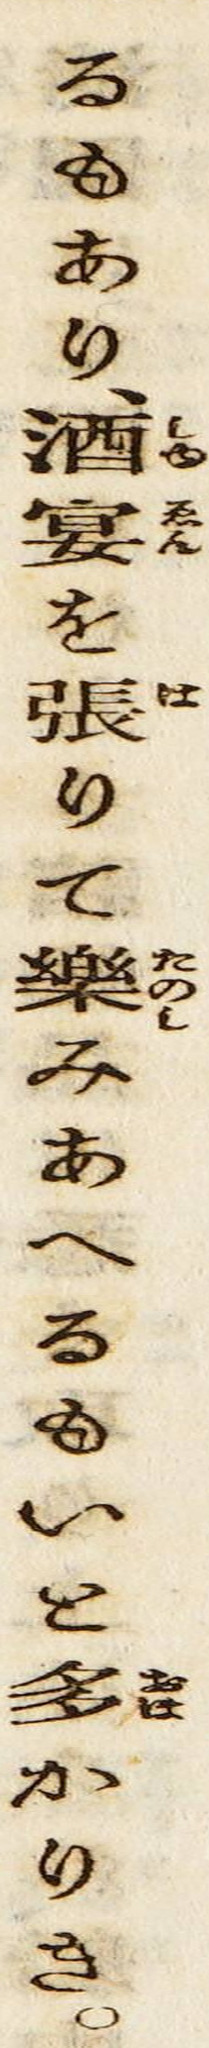るもあり、酒宴を張りて楽みあへるもいと多かりき。
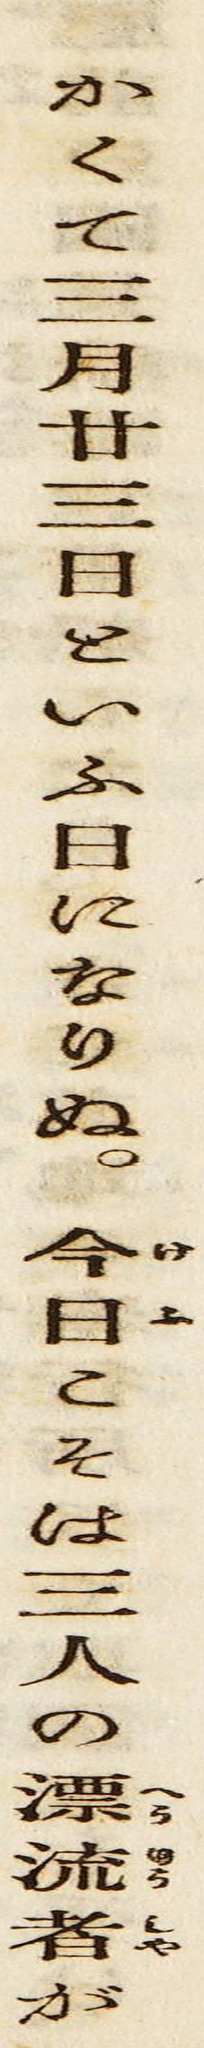かくて三月廿三日といふ日になりぬ。今日こそは三人の漂流者が
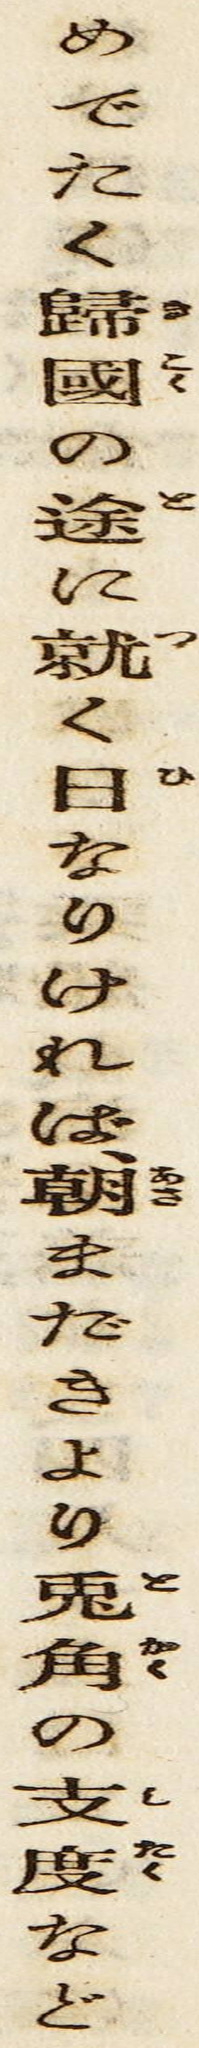めでたく帰国の途に就く日なりければ、朝まだきより兎角の支度など
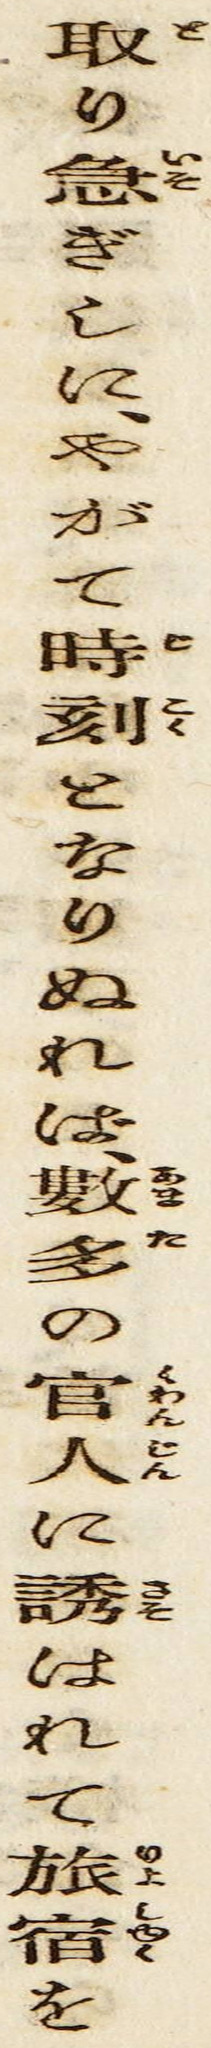取り急ぎしに、やがて時刻となりぬれば、数多の官人に誘はれて旅宿を
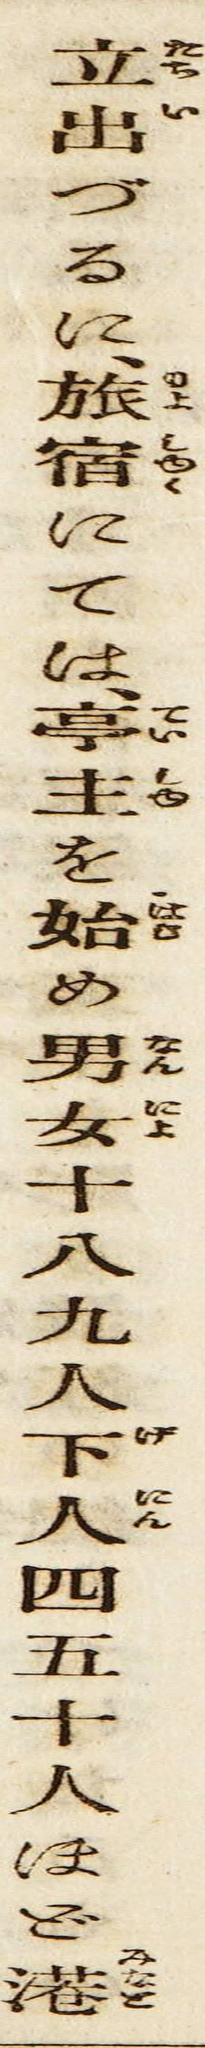立出づるに、旅宿にては、亭主を始め男女十八九人下人四五十人ほど港
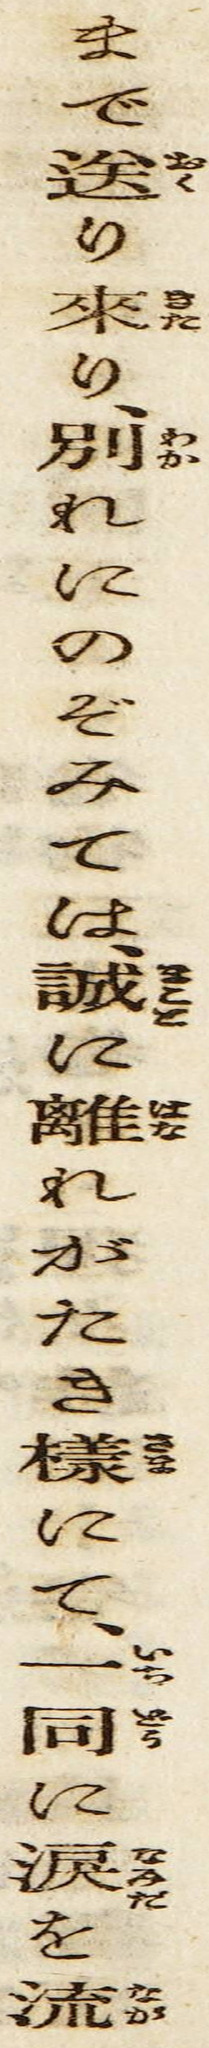まで送り来り、別れにのぞみては、誠に離れがたき様にて、一同に涙を流
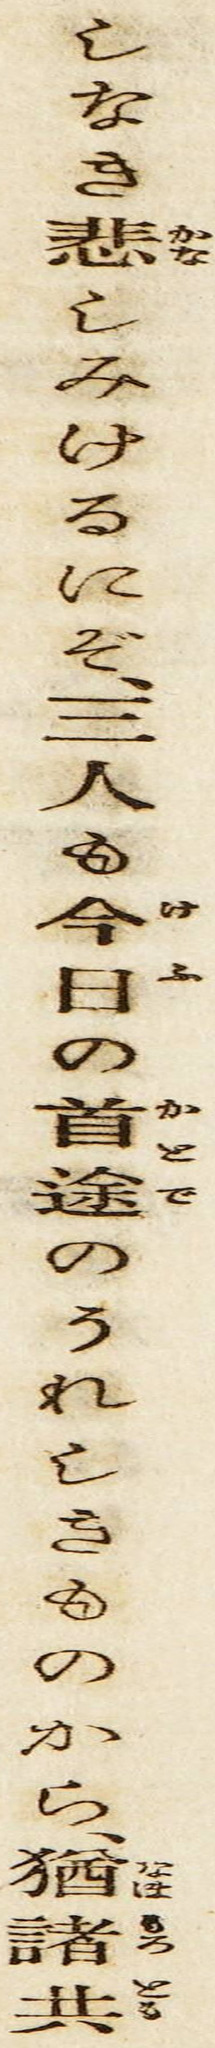しなき悲しみけるにぞ、三人も今日の首途のうれしきものから、猶諸共
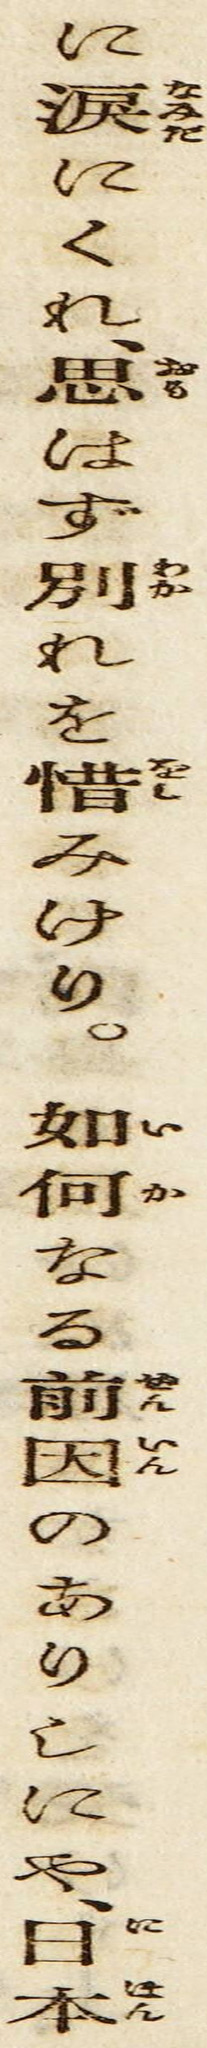に涙にくれ、思はず別れを惜みけり。如何なる前因のありしにや、日本

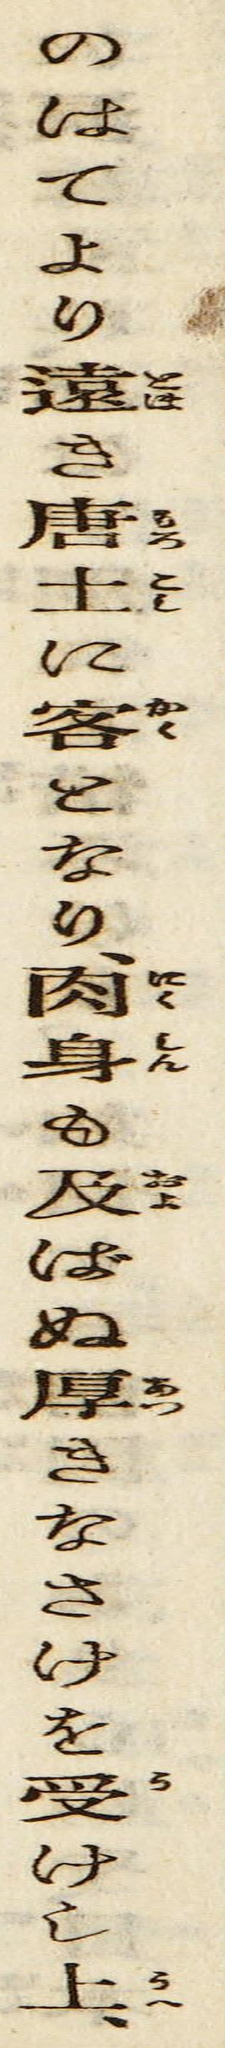のはてより遠き唐土に客となり、肉親も及ばぬ厚きなさけを受けし上、
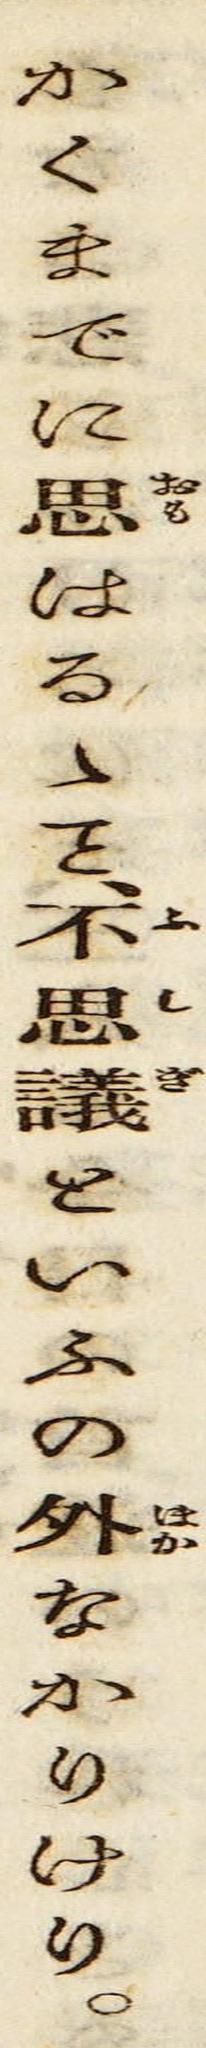かくまでに思はるゝこと、不思議といふの外なかりけり。
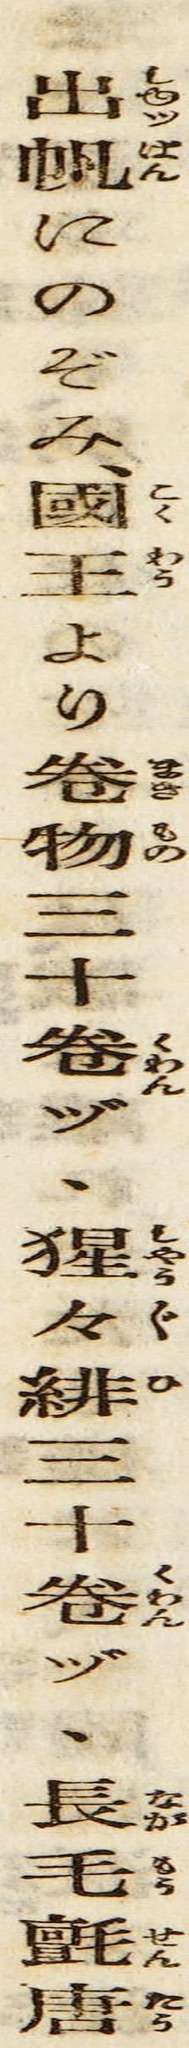出帆にのぞみ、国王より巻物三十巻ヅヽ猩々緋三十巻ヅヽ長毛氈唐
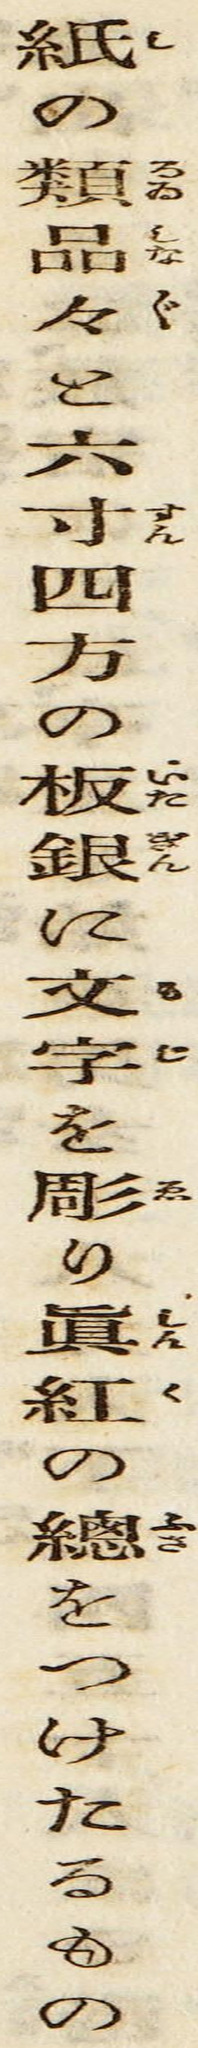紙の類品々と六寸四方の板銀に文字を彫り真紅の総をつけたるもの
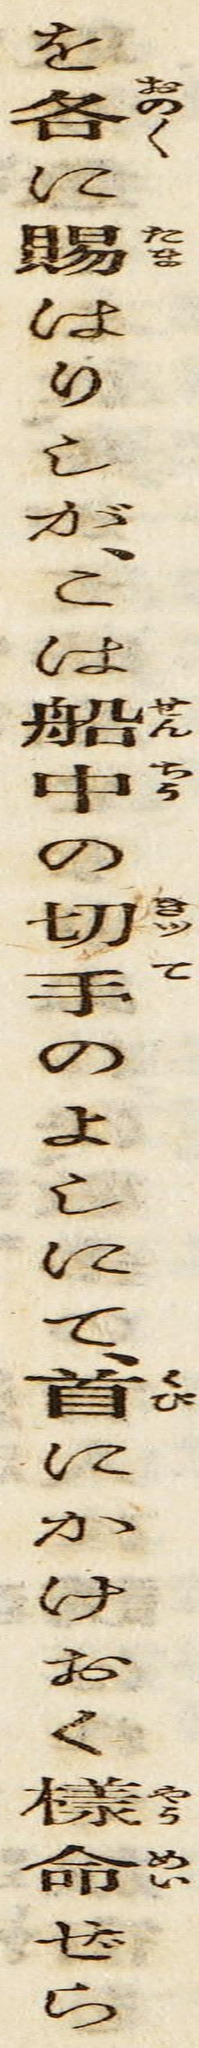を各に賜はりしが、こは船中の切手のよしにて、首にかけおく様命ぜら
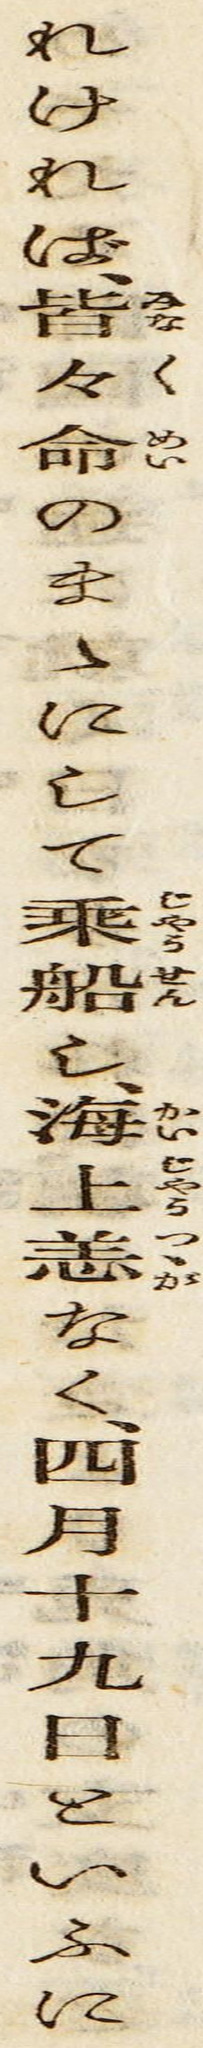れければ、皆々命のまゝにして乗船し、海上恙なく、四月十九日といふに
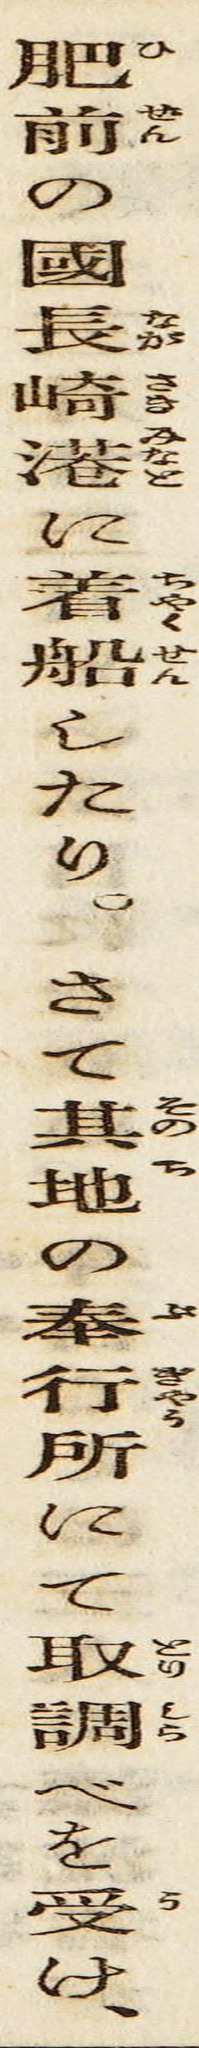肥前の国長崎港に着船したり。さて其地の奉行所にて取調べを受け、
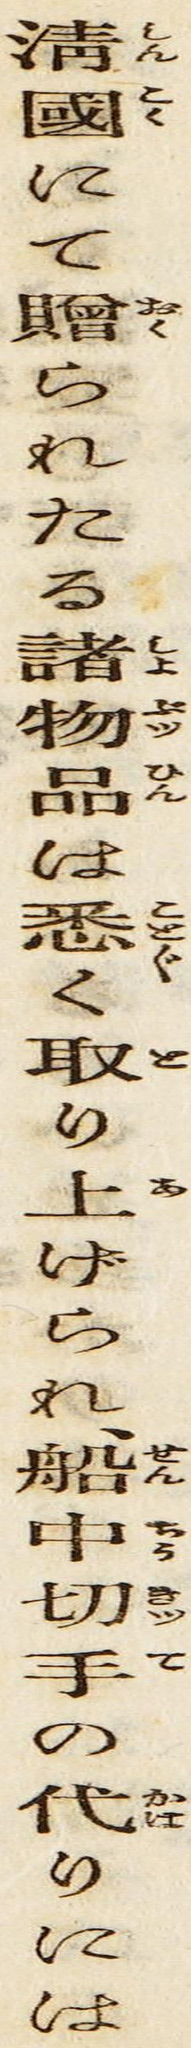清国にて贈られたる諸物品は悉く取り上げられ、船中切手の代りには
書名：日本漂流譚
